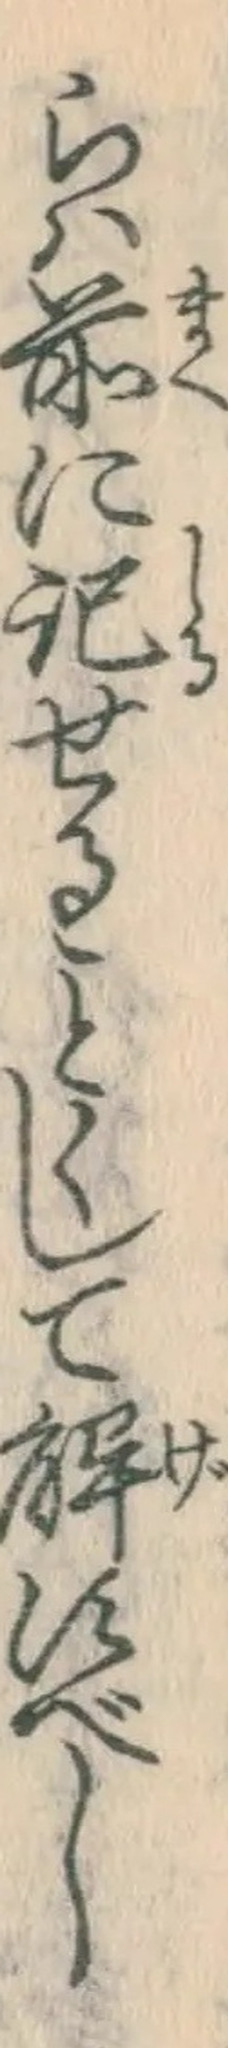らは前に記せることくして解すべし
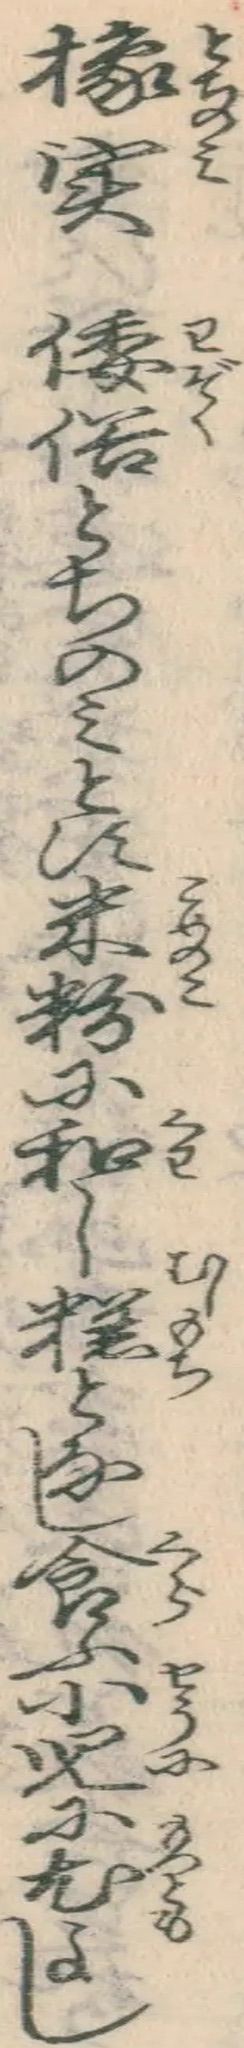橡実倭俗とちのみとす米粉に和し糕となし食ふ小児に尤よし
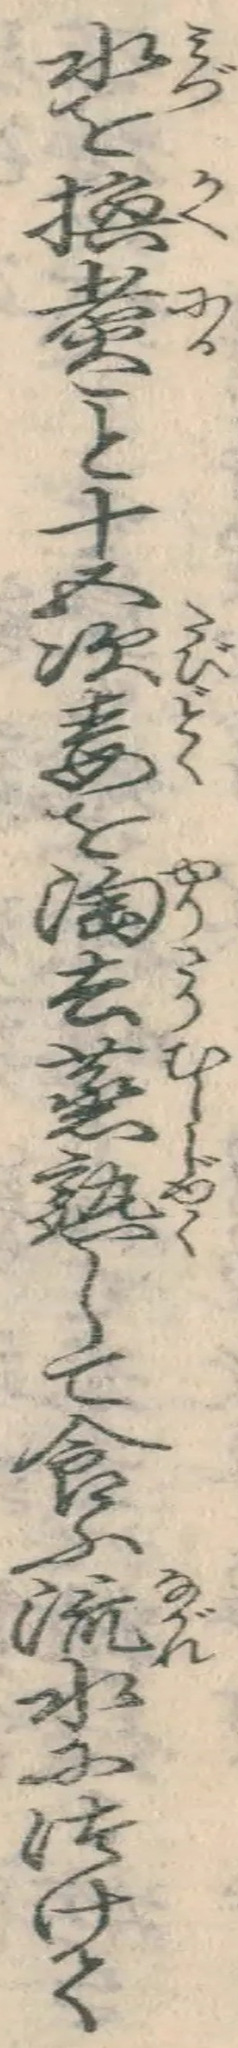水を換煑こと十五次毒を淘去蒸熟して食ふ流水につけて
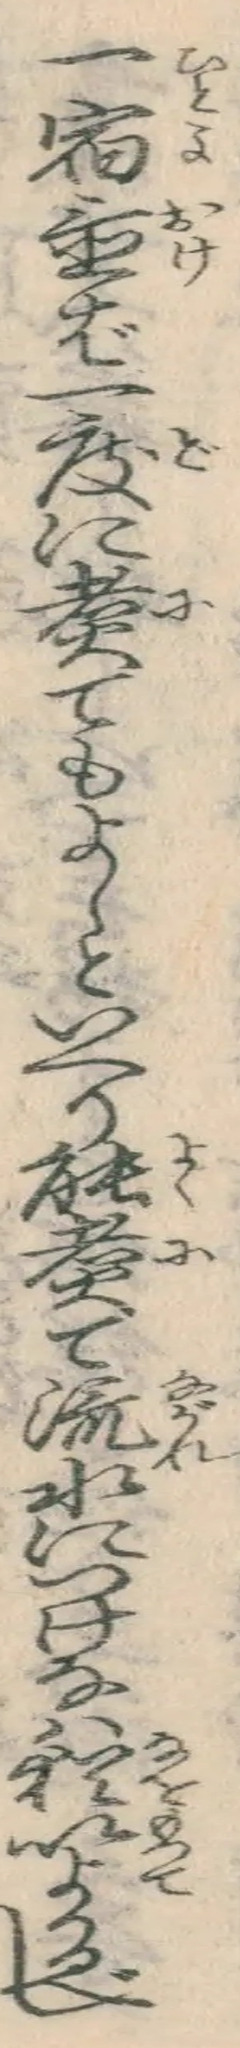一宿置ば一度に煑てもよしといへり能煑て流水につけなは猶以よかるべし
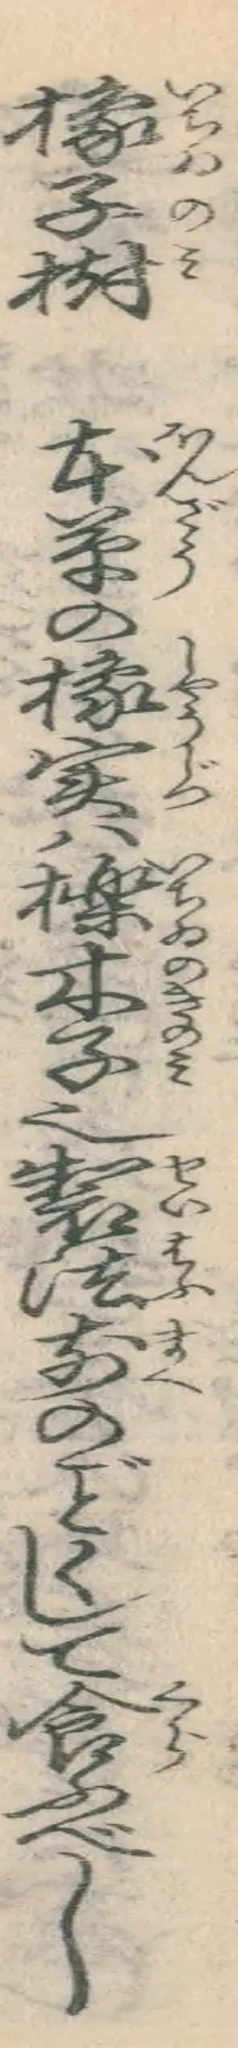橡子樹本草の橡実は檪木子也製法前のごとくして食ふべし
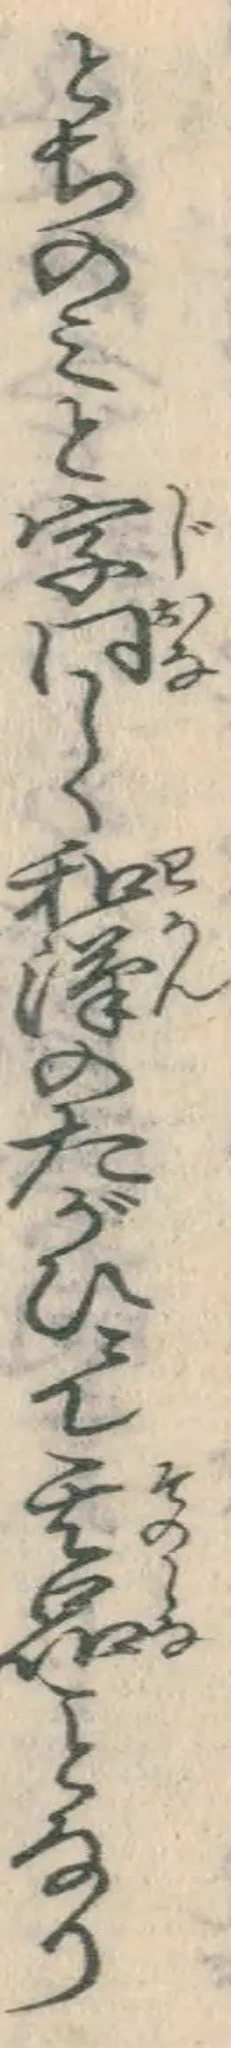とちのみと字同しく和漢のたがひにて其品ことなり
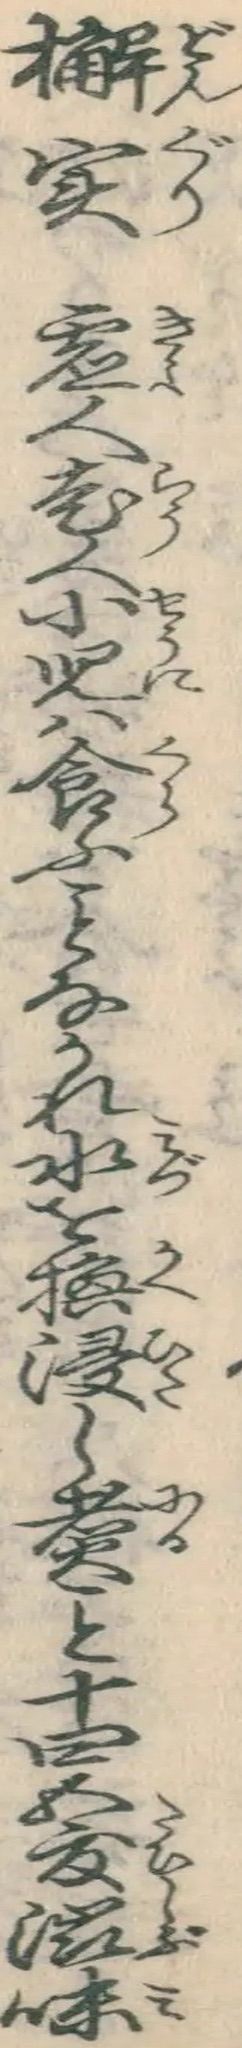檞実虚人老人小児は食ふことなかれ水を換浸し煑こと十四五度渋味
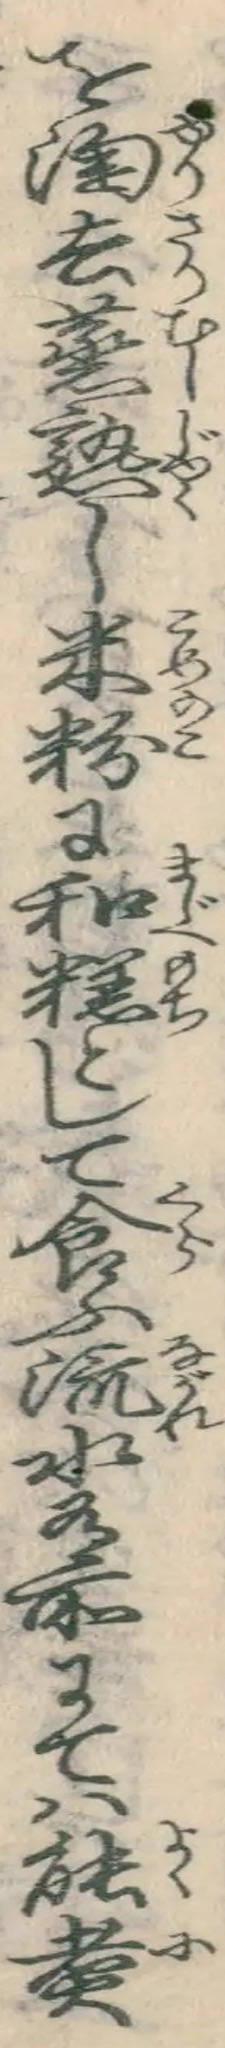を淘去蒸熟し米粉に和糕として食ふ流水有所にては能煑
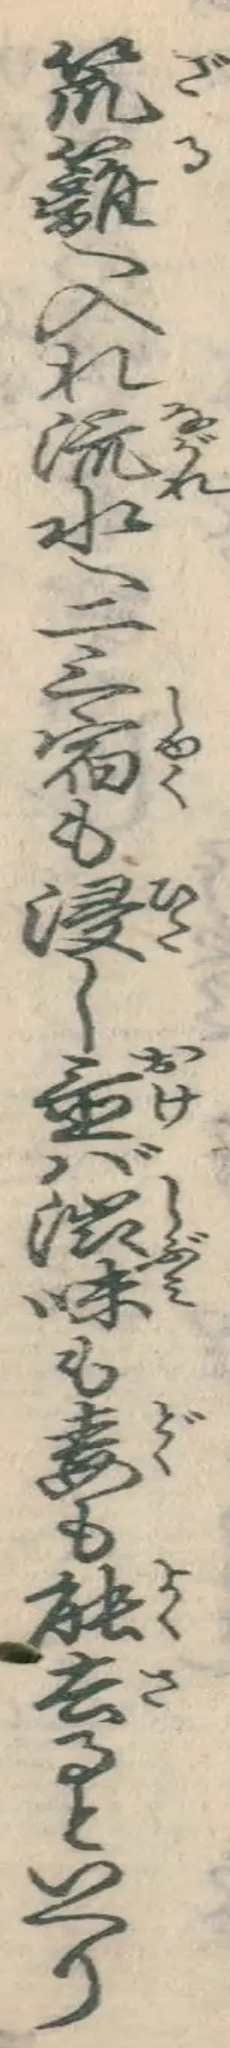笊籠へ入れ流水へ二三宿も浸し置ば渋味も毒も能去るといへり

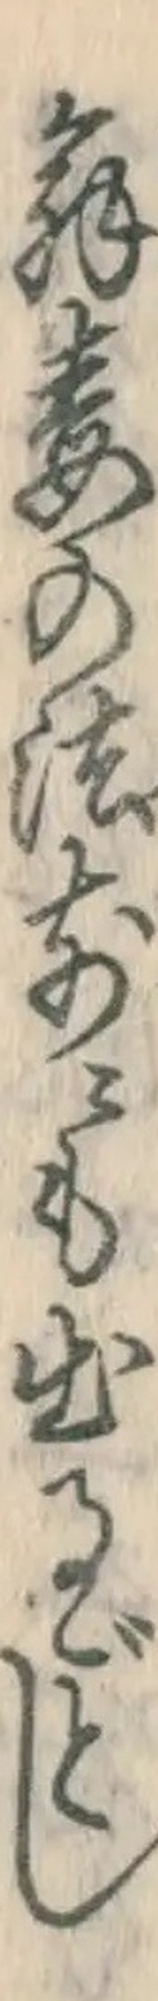解毒の法前にも出るごとし
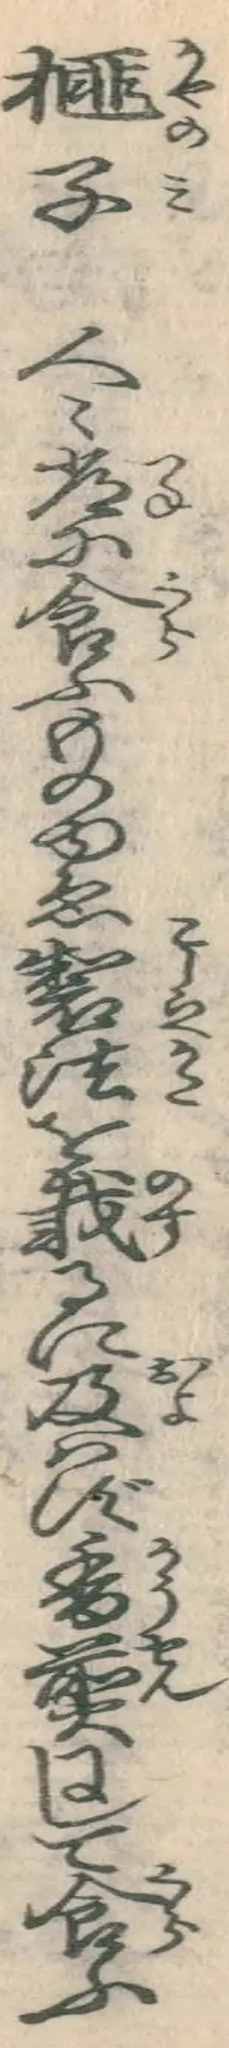榧子人々常に食ふものゆゑ製法を載るに及はず香煎にして食ふ
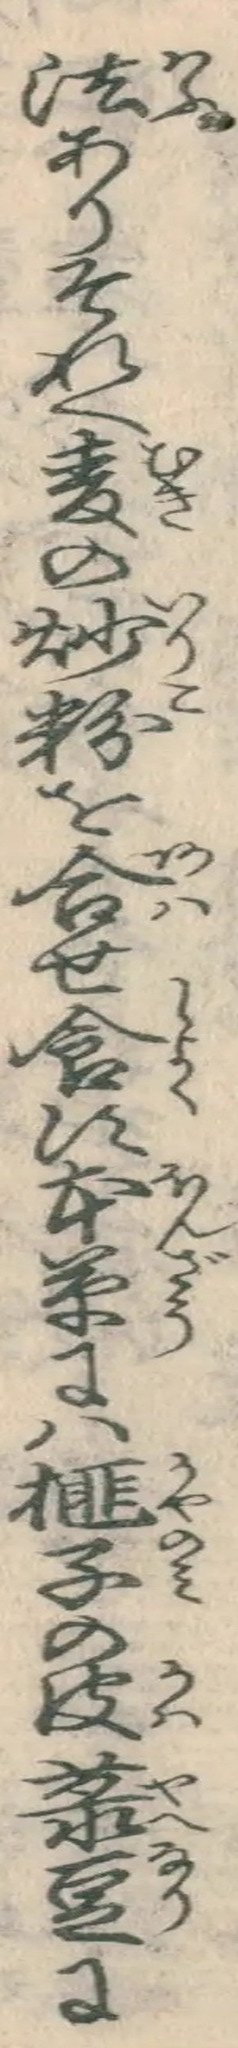法ありそれへ麦の炒粉を合せ食す本草には榧子の皮菉豆に
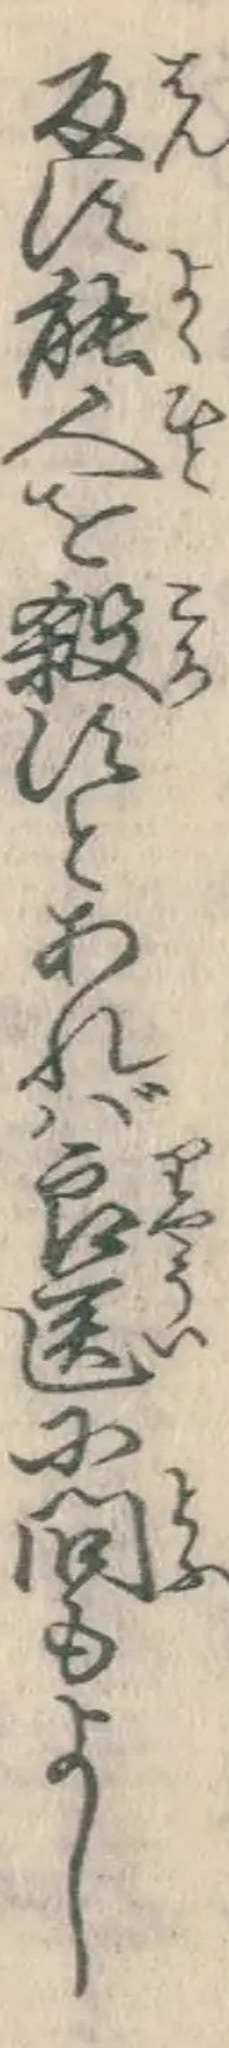反す能人を殺すとあれば良医に問もよし
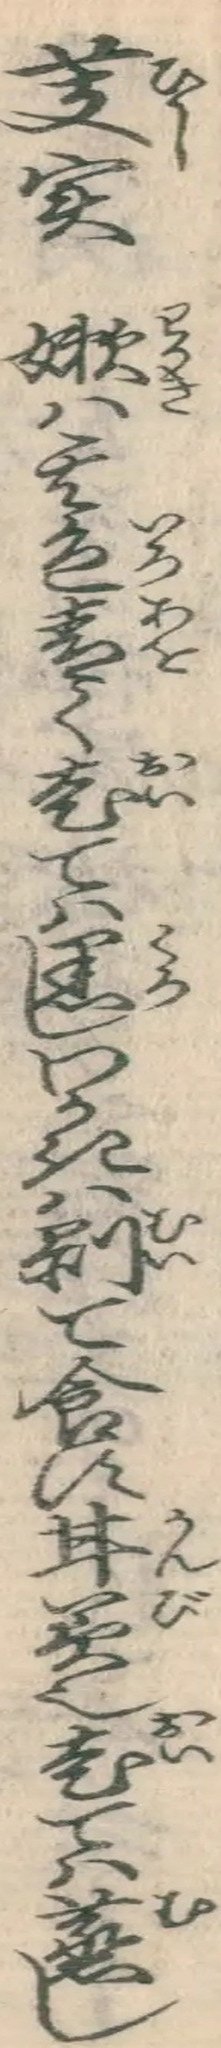芰実嫰は其色青く老ては黒しわかきは剥て食す甘美也老ては蒸し
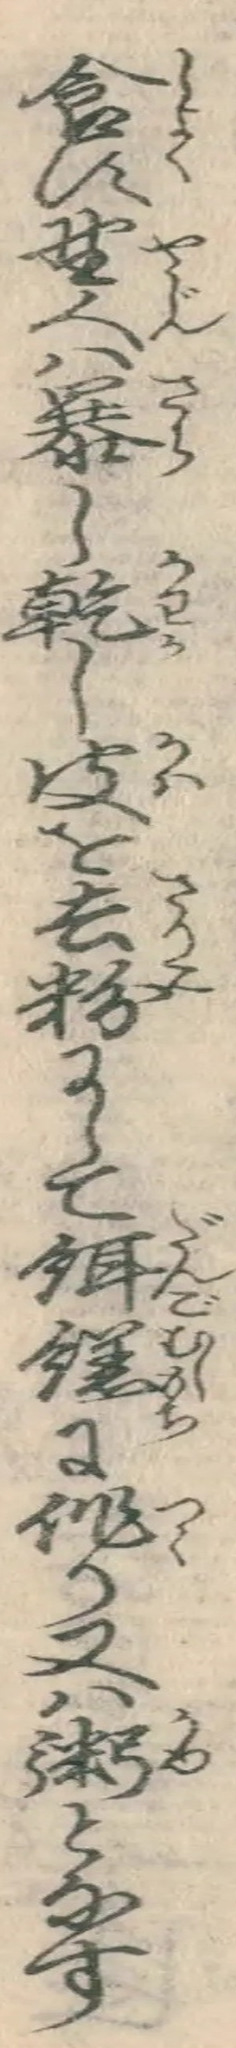食す野人は暴し乾し皮を去粉にして餌餻に作り又は粥となす
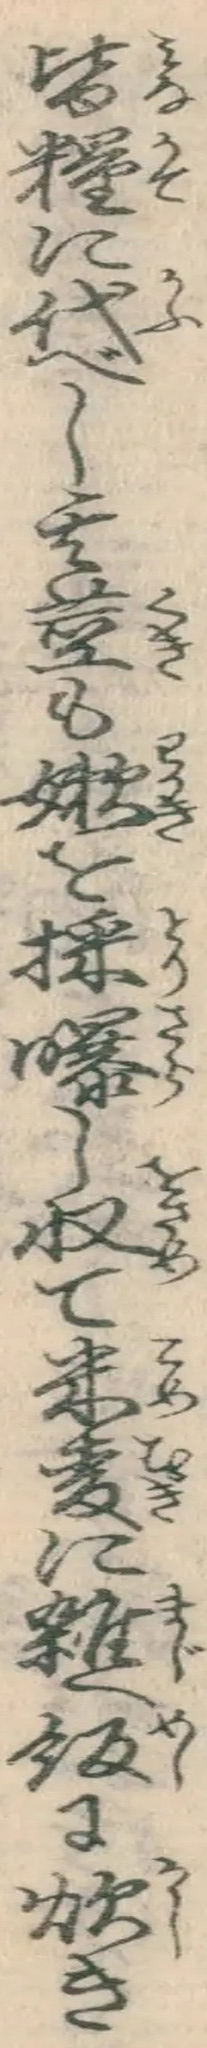皆糧に代べし其茎も嫰を採曝し収て米麦に雑へ飯に炊き
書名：経済をしへ草
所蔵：国立国会図書館 National Diet Library, JAPAN
